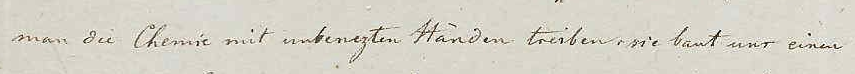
man die Chemie mit unbenezten Händen treiben: sie baut uns einen
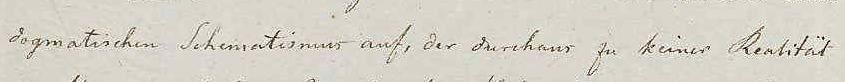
dogmatischen Schematismus auf, der durchaus zu keiner Realität
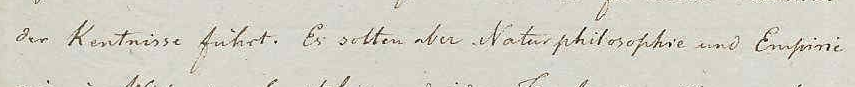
der Kentnisse führt. Es solten aber Naturphilosophie und Empirie
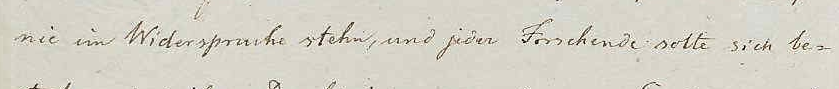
nie im Widerspruche stehn, und jeder Forschende solte sich be-
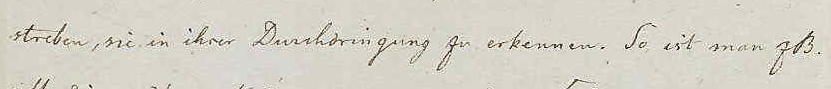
streben, sie in ihrer Durchdringung zu erkennen. So ist man zB.
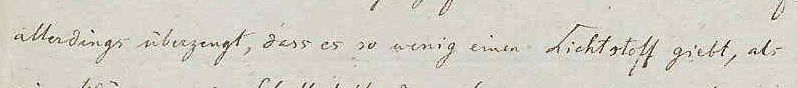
allerdings überzeugt, dass es so wenig einen Lichtstoff giebt, als
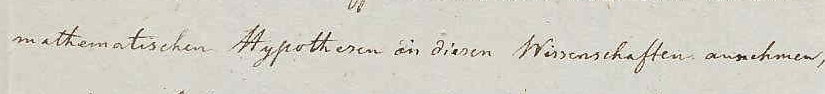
mathematischen Hypothesen in diesen Wissenschaften annehmen,
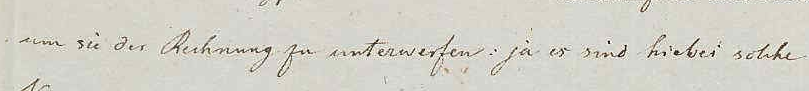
um sie der Rechnung zu unterwerfen: ja es sind hiebei solche
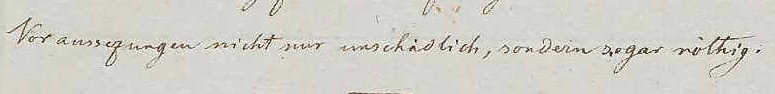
Voraussezungen nicht nur unschädlich, sondern sogar nöthig.
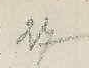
bei ihnen
